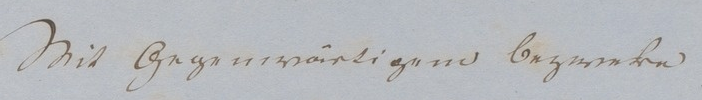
Mit Gegenwärtigem bezweke
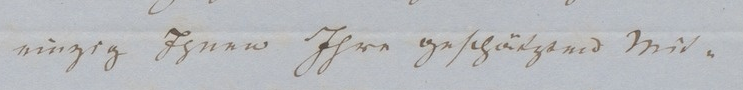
einzig Ihnen Ihre geschätzten Mit-
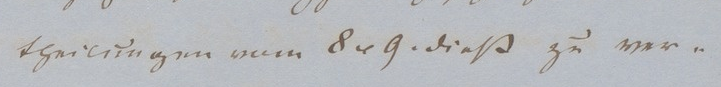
theilungen vom 8 & 9. dieß zu ver-
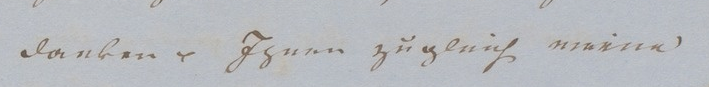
danken & Ihnen zugleich meine
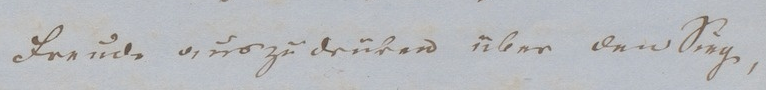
Freude auszudrüken über den Sieg,
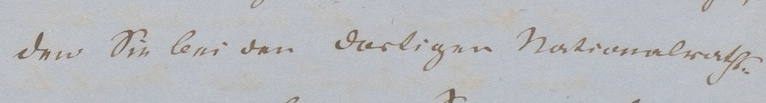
den Sie bei den dortigen Nationalraths-
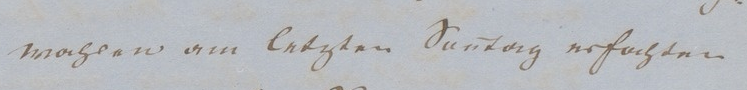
wahlen am letzten Sonntag erfochten
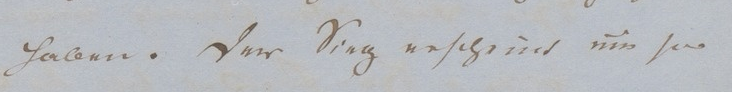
haben. Der Sieg erscheint um so
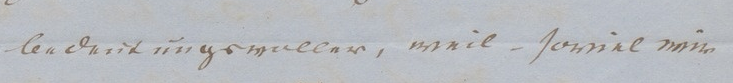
bedeutungsvoller, weil – soviel wir
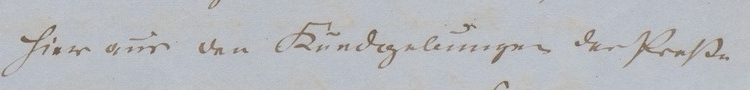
hier aus den Kundgebungen der Preße
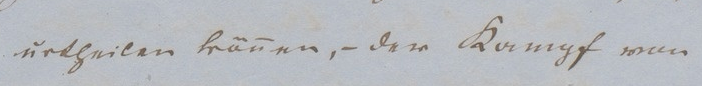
urtheilen können, – der Kampf von
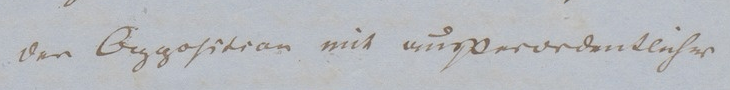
der Opposition mit außerordentlicher
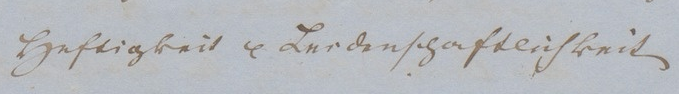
Heftigkeit & Leidenschaftlichkeit
